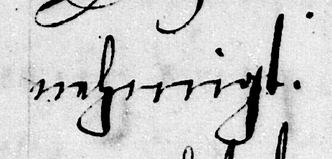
nehmigt.
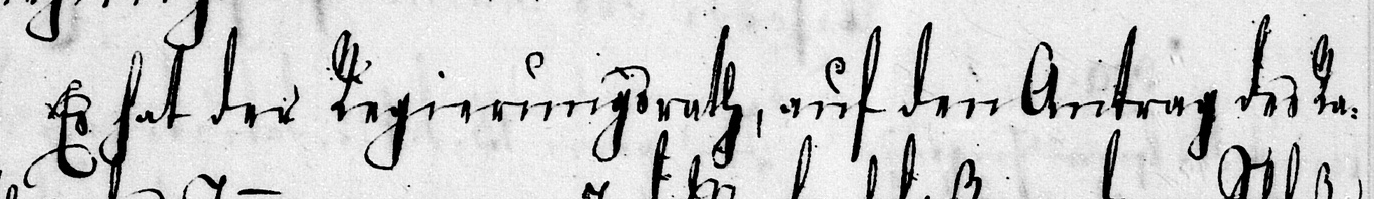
Es hat der Regierungsrath, auf den Antrag des R¬
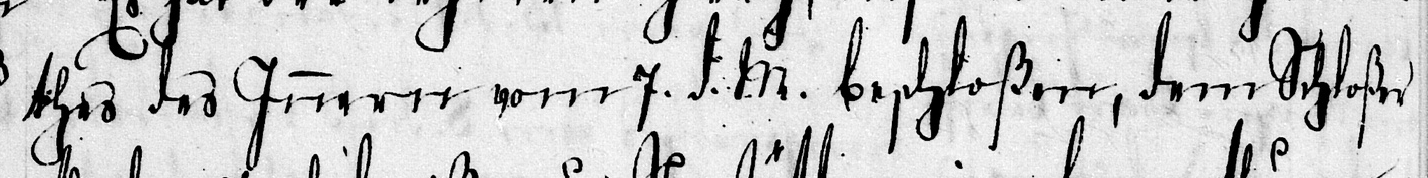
athes des Innern vom 7. d. M. beschloßen, dem Schloßer
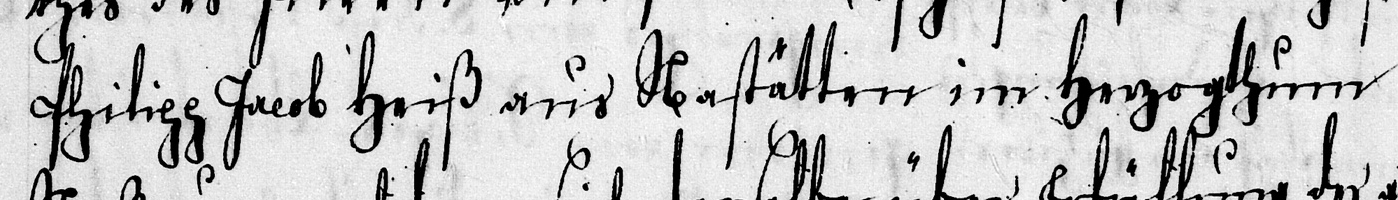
Philipp Jacob Heiß aus Nastätten im Herzogthum
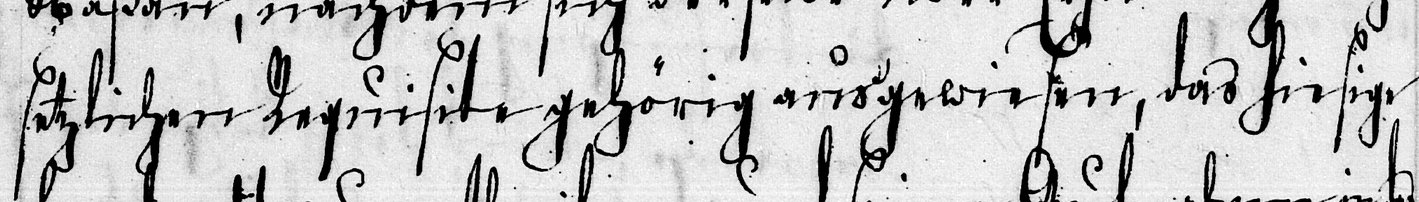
setzlichen Requisite gehörig ausgewiesen, das hiesige
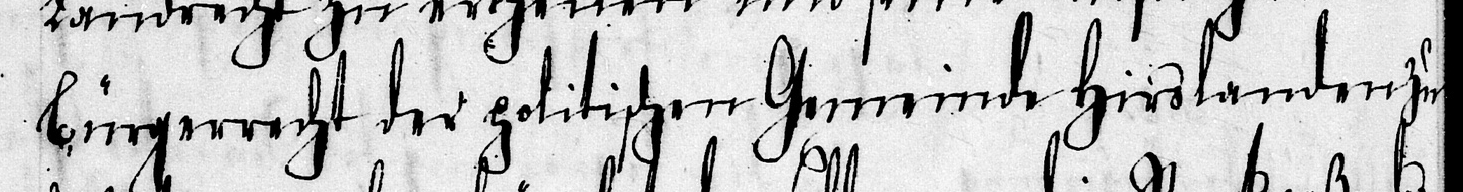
Bürgerrecht der politischen Gemeinde Hirslanden zu
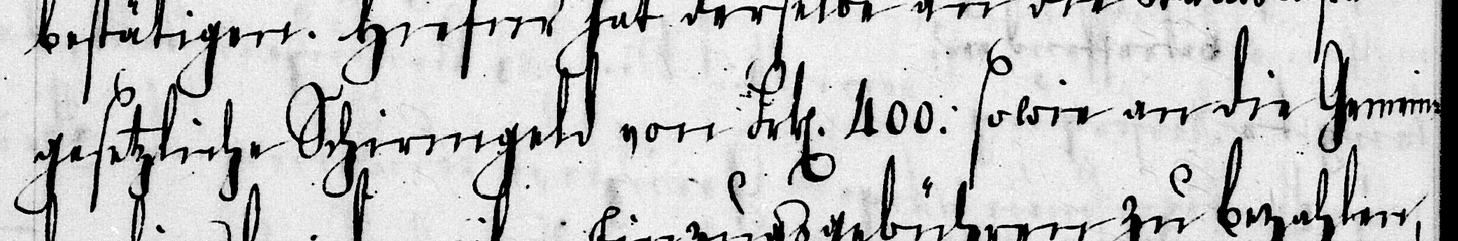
gesetzliche Schirmgeld von Frk[en]. 400: sowie an die Gemei¬
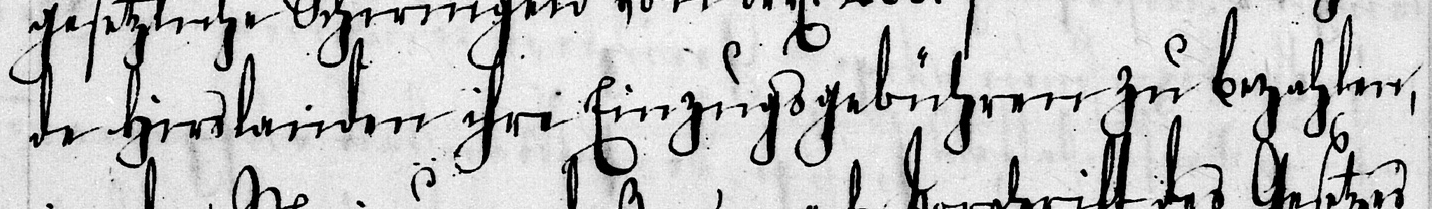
nde Hirslanden ihre Einzugsgebühren zu bezahlen,
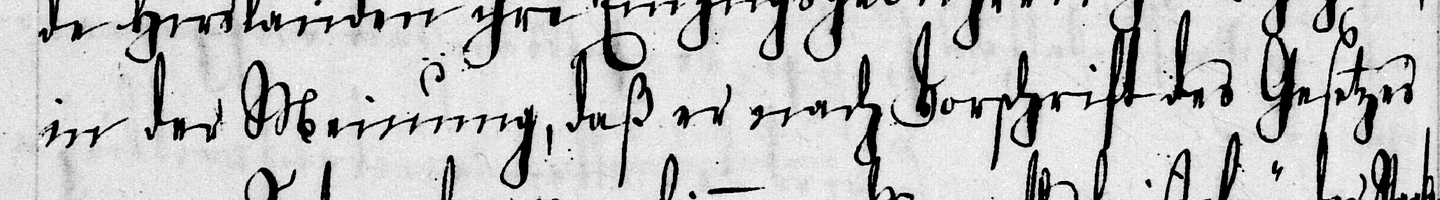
in der Meinung, daß er nach Vorschrift des Gesetzes
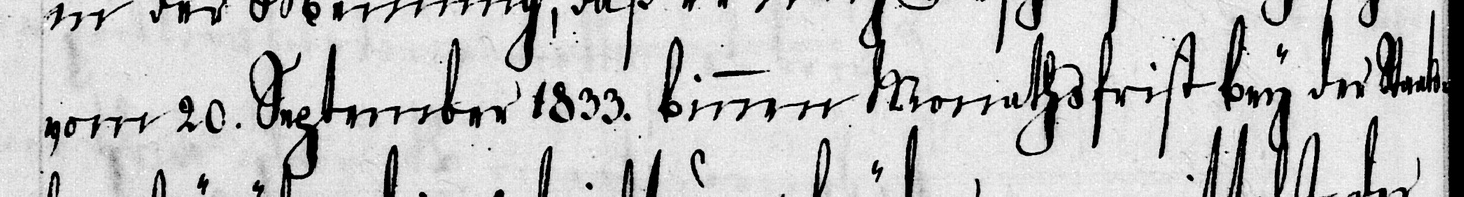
vom 20. September 1833. binnen Monathsfrist bey der Sta¬
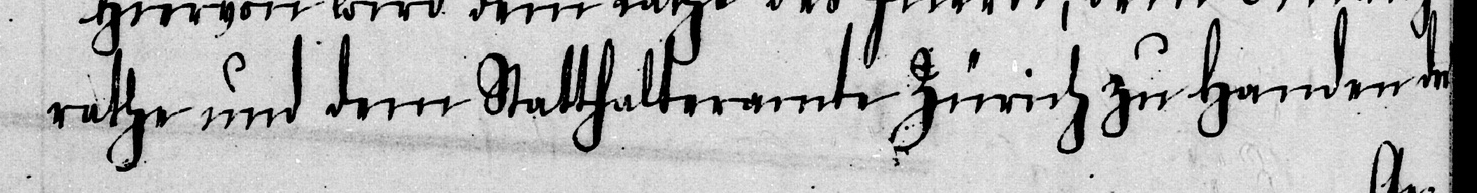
rathe und dem Statthalteramte Zürich zu Handen der
